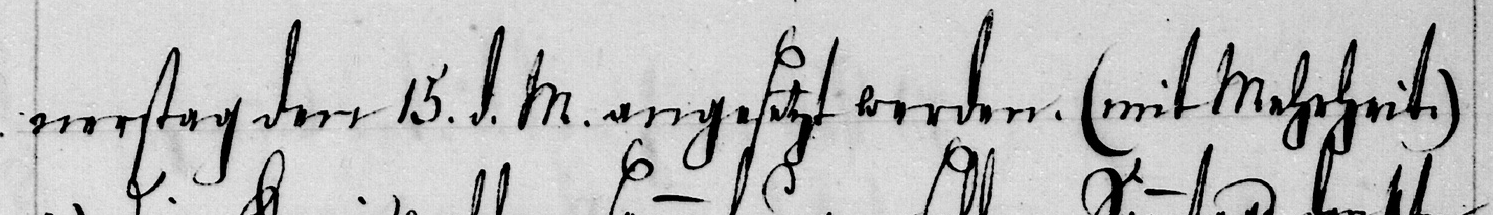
nerstag den 15. d. M. angesetzt werden. (mit Mehrheit.)
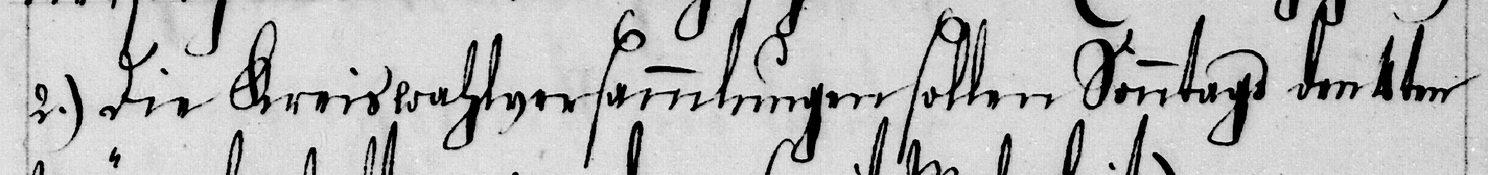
2.) Die Kreiswahlversammlungen sollen Sonntags den 4ten
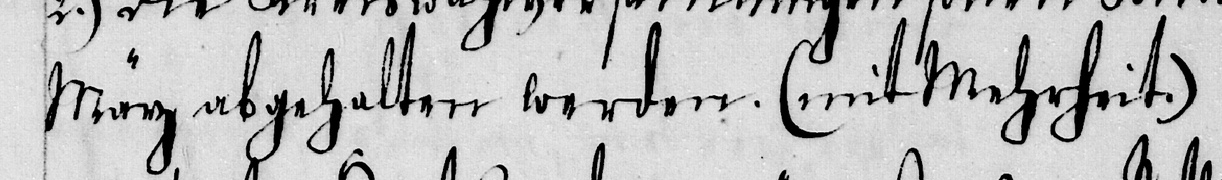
März abgehalten werden. (mit Mehrheit.)
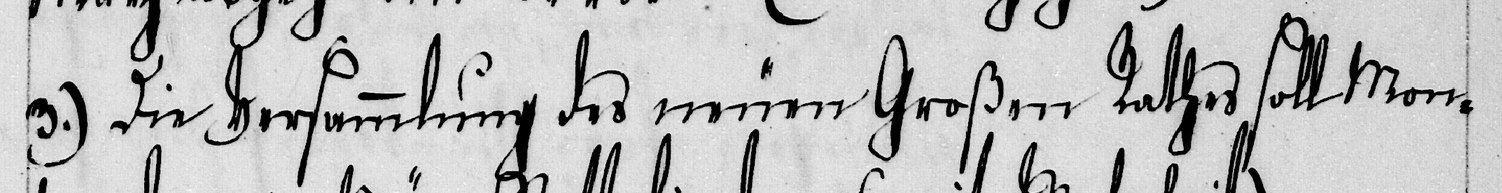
3.) Die Versammlung des neuen Großen Rathes soll Mon¬
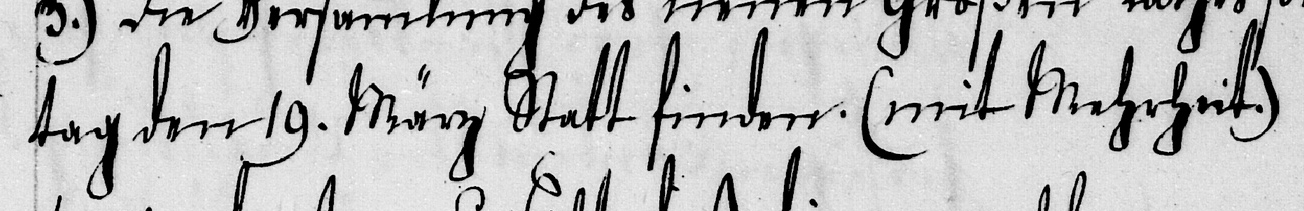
tag den 19. März Statt finden. (mit Mehrheit.)
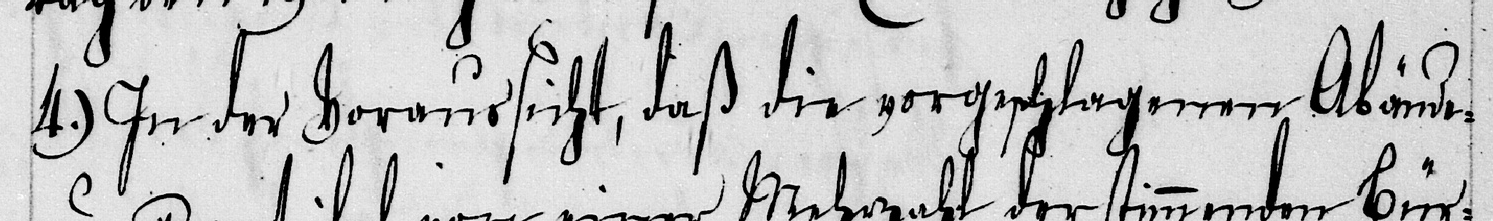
4.) In der Voraussicht, daß die vorgeschlagenen Abände¬
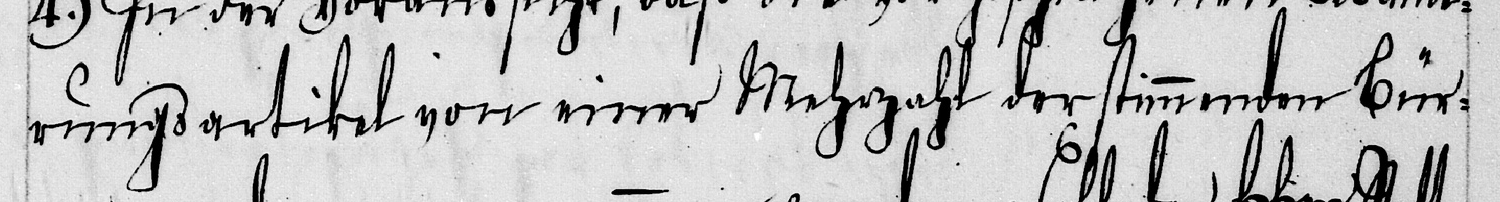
rungsartikel von einer Mehrzahl der stimmenden Bür¬
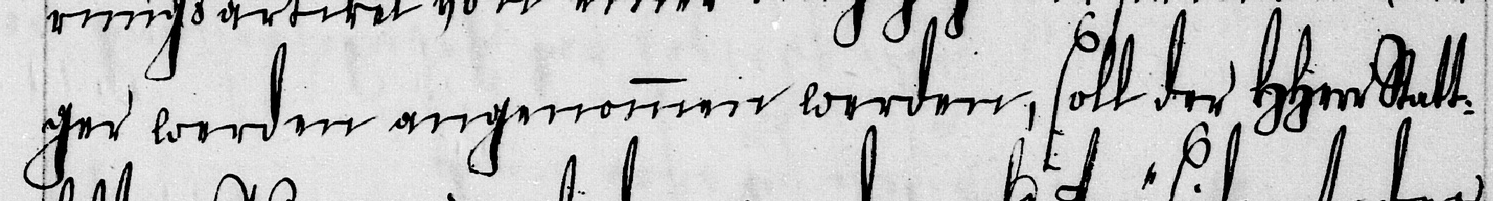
ger werden angenommen werden, soll der HHerr Stat¬
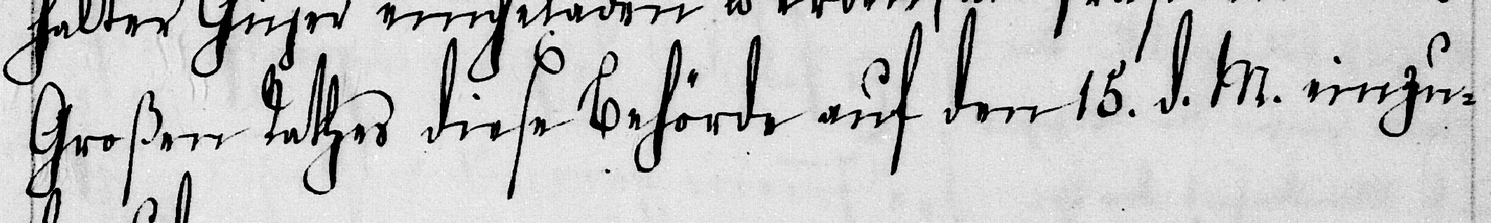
Großen Rathes diese Behörde auf den 15. d. M. einzu¬
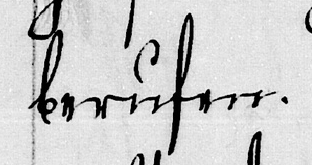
berufen.
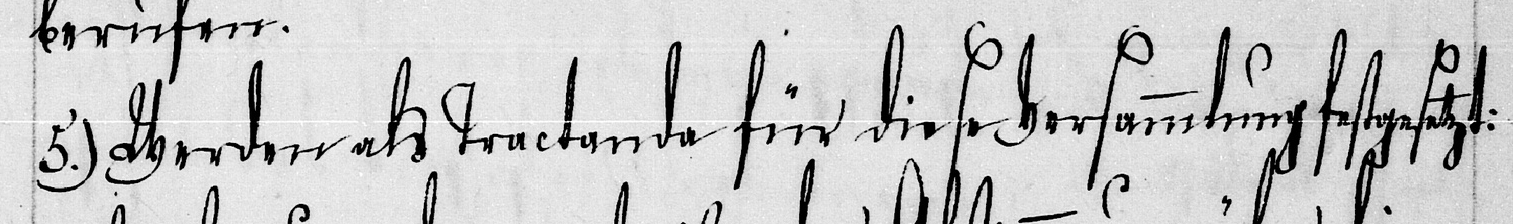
Werden als Tractanda für diese Versammlung
